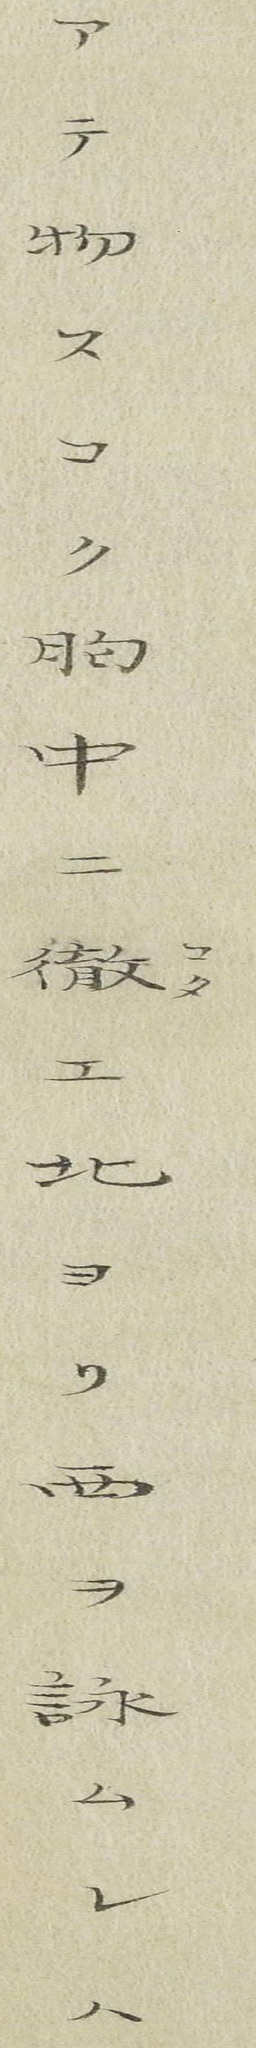アテ物スコク胸中ニ徹エ北ヨリ西ヲ詠ムレハ
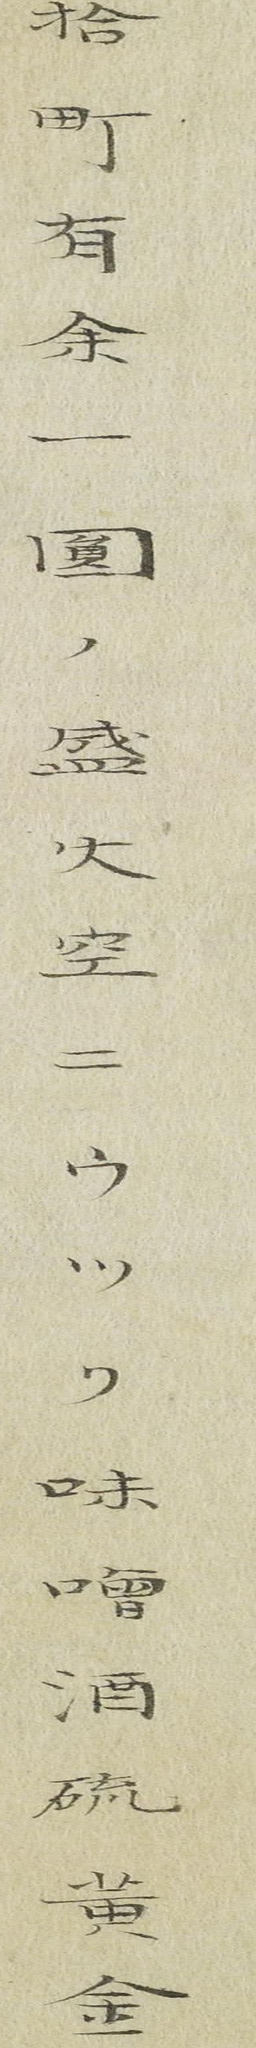拾町有余一円ノ盛火空ニウツリ味噌酒硫黄金
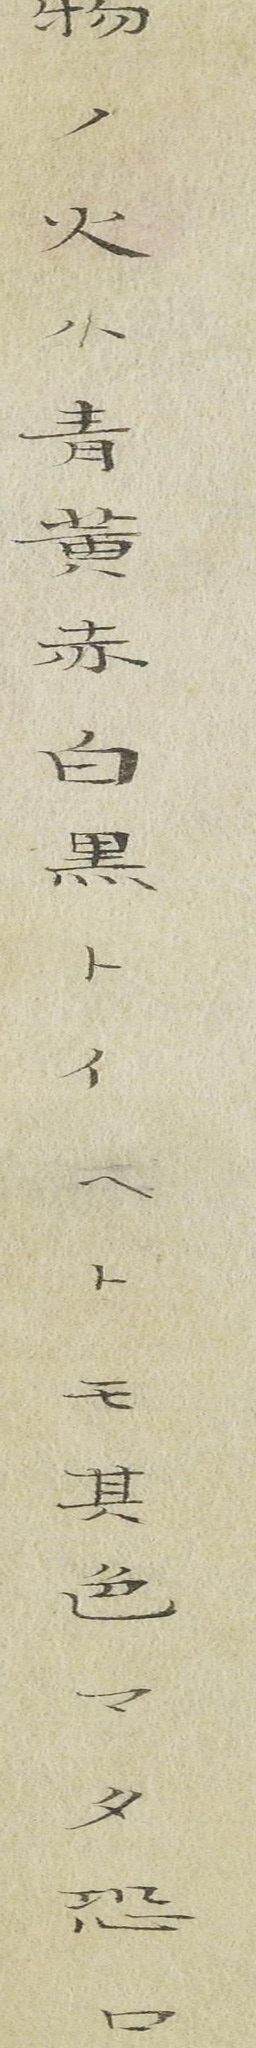物ノ火ハ青黄赤白黒トイヘトモ其色マタ恐ロ
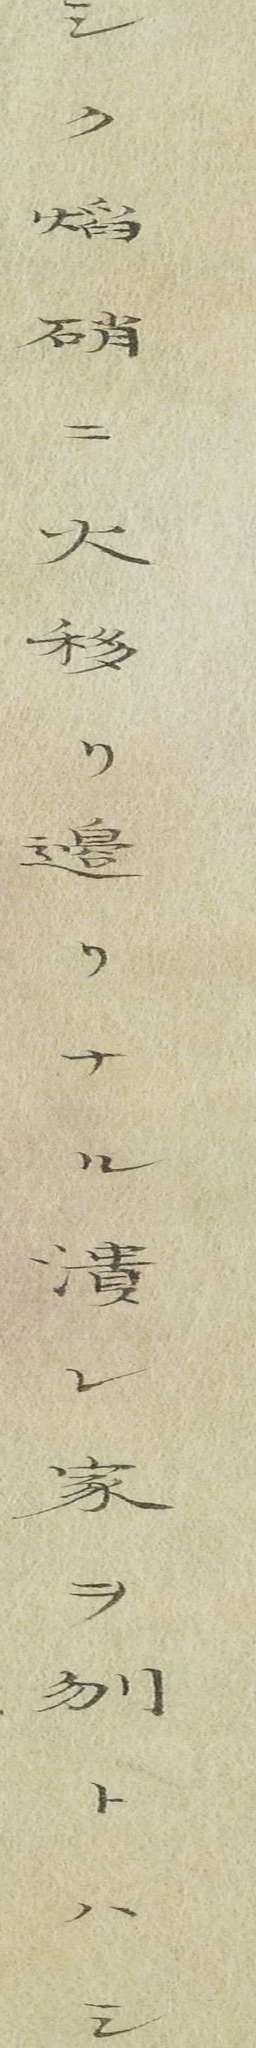シク焔硝ニ火移リ辺リナル潰レ家ヲ刎トハシ
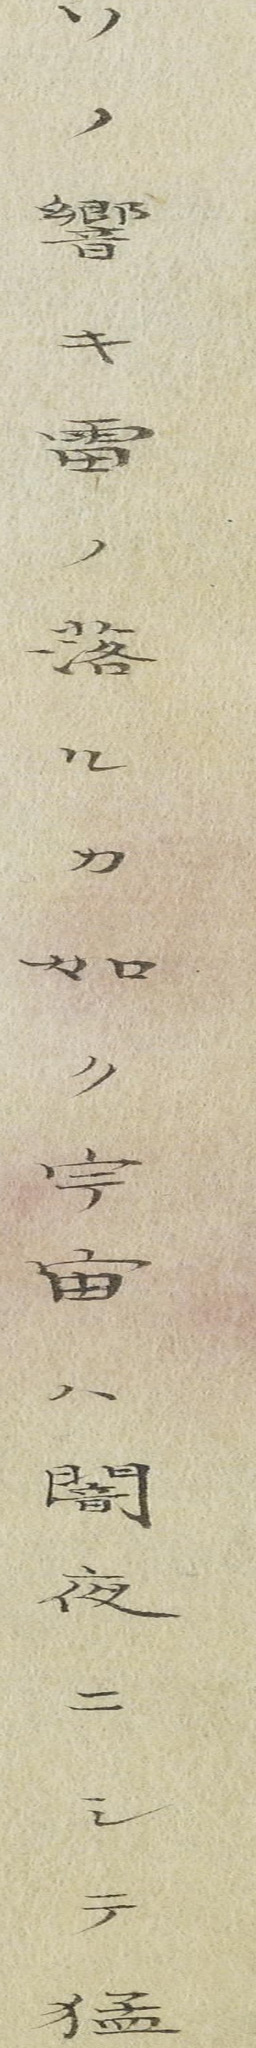ソノ響キ雷ノ落ルカ如ク宇宙ハ暗夜ニシテ猛
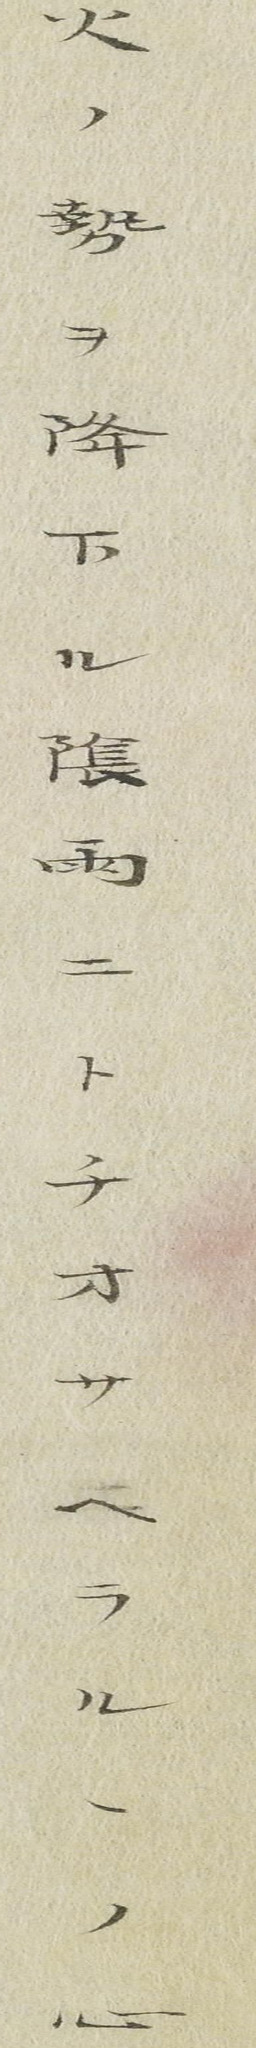火ノ勢ヲ降下ル隂雨ニトチオサヘラルヽノ心
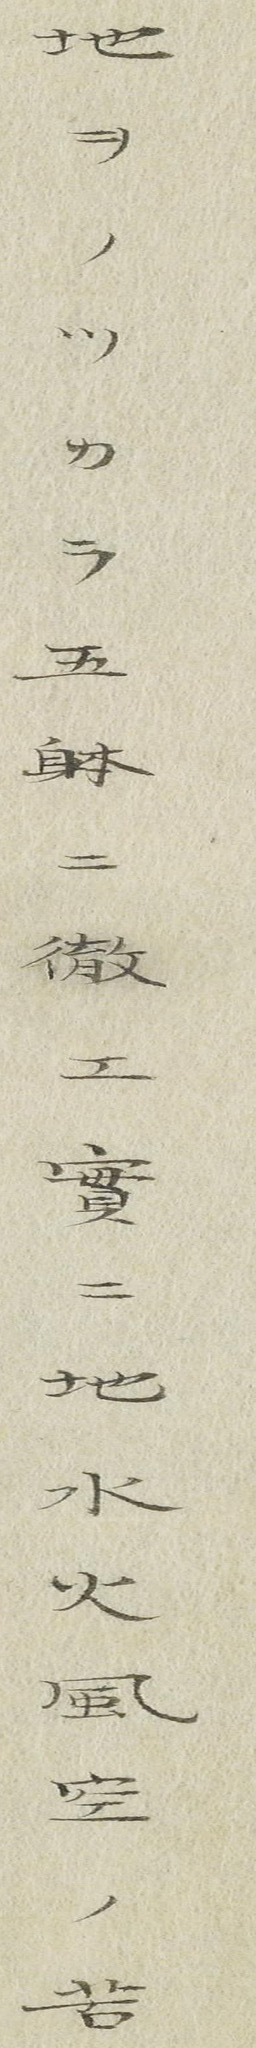地ヲノツカラ五体ニ徹エ実ニ地水火風空ノ苦
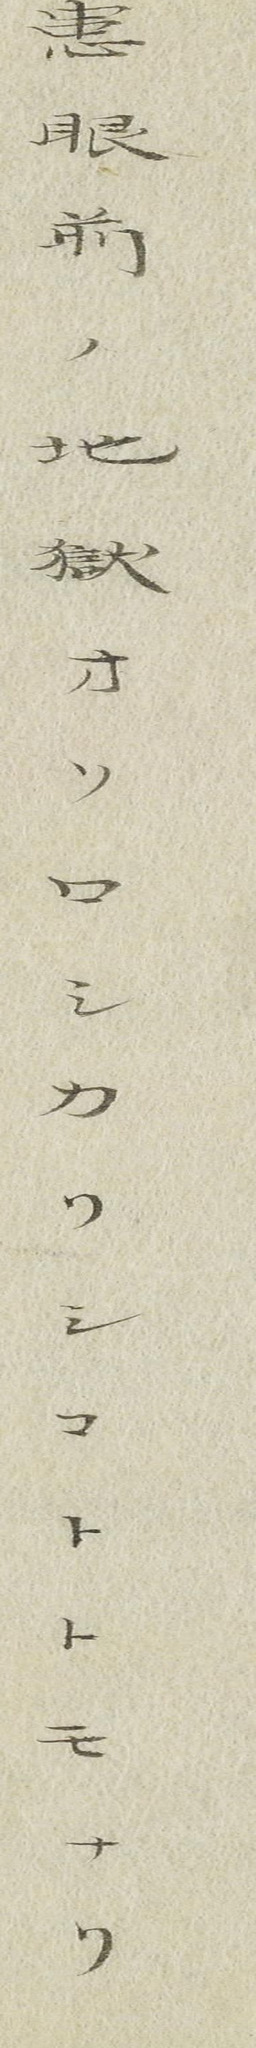患眼前ノ地獄オソロシカリシコトトモナリ
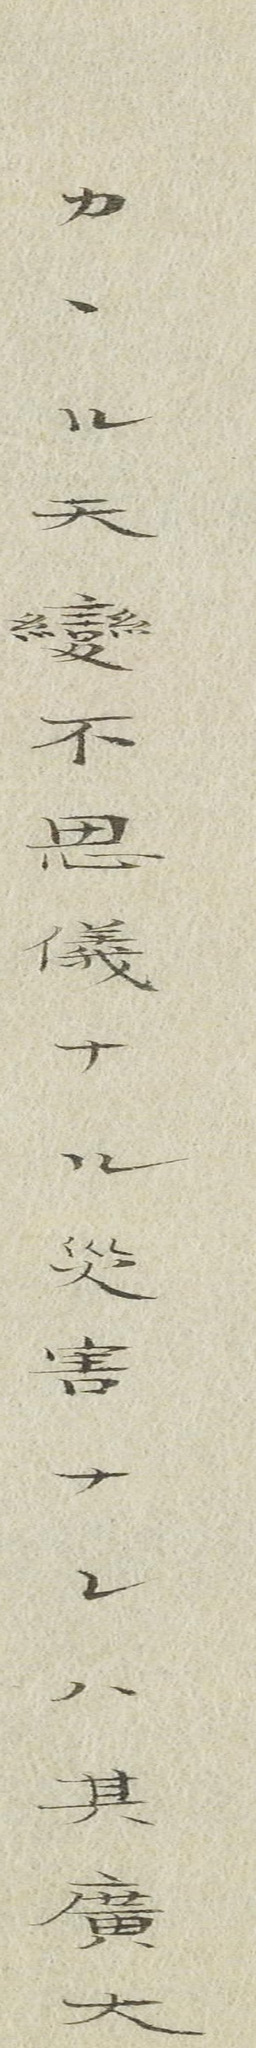カヽル天変不思儀ナル災害ナレハ其広大
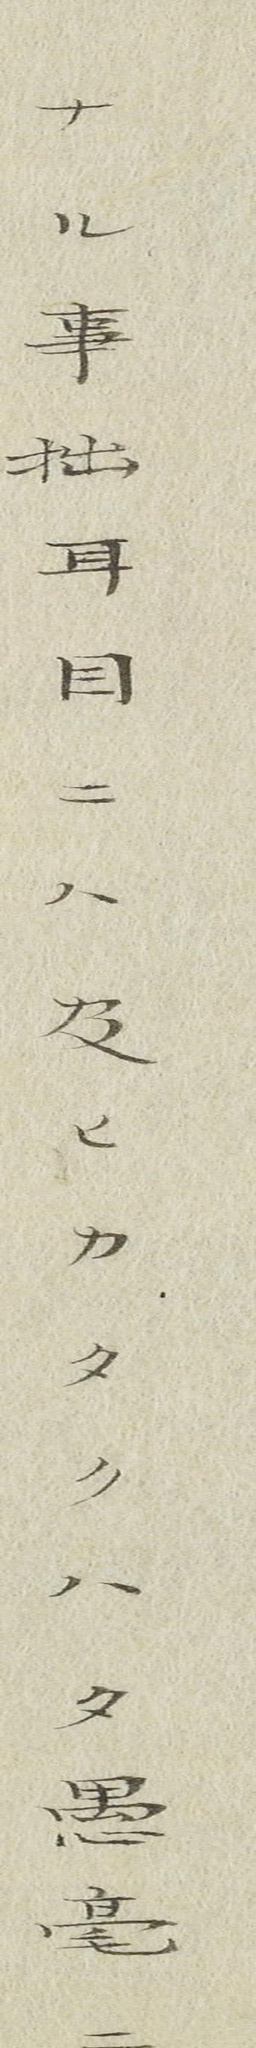ナル事拙耳目ニハ及ヒカタクハタ愚毫ニ
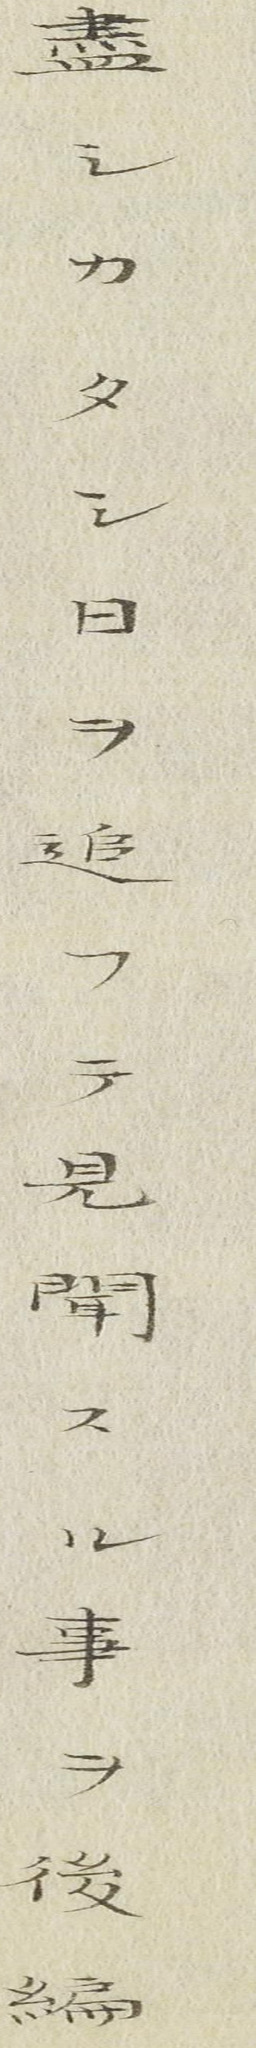尽シカタシ日ヲ追フテ見聞スル事ヲ後編
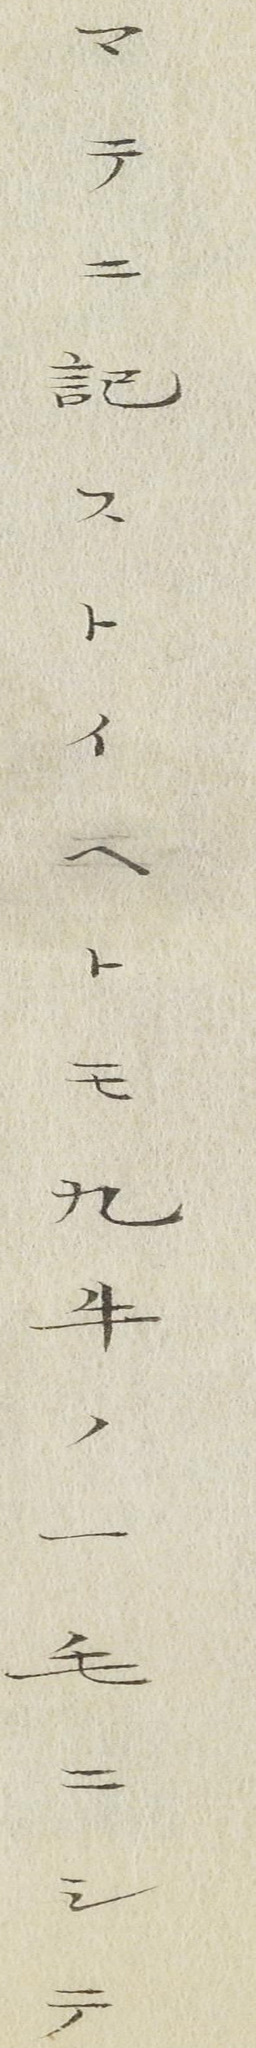マテニ記ストイヘトモ九牛ノ一毛ニシテ
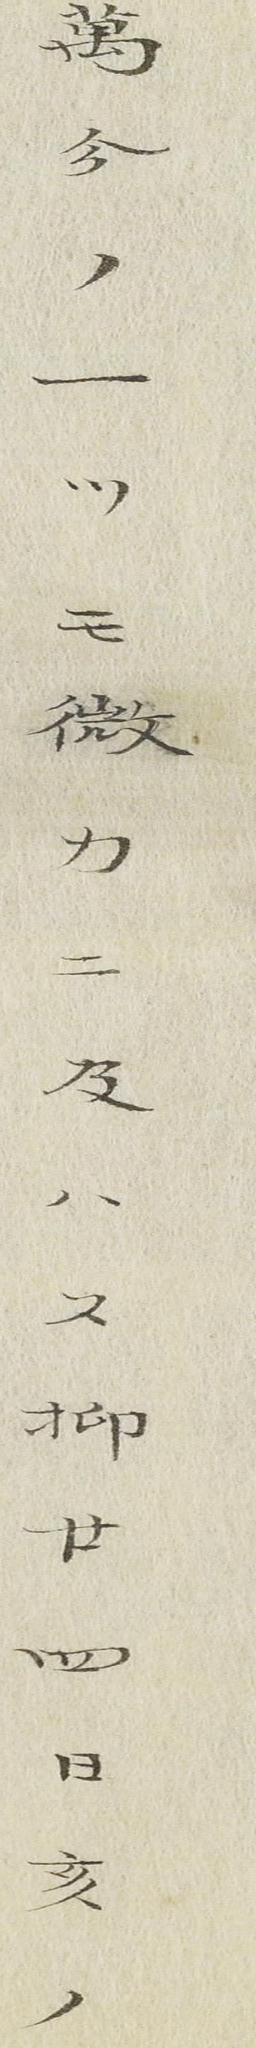万分ノ一ツモ微力ニ及ハス抑廿四日亥ノ
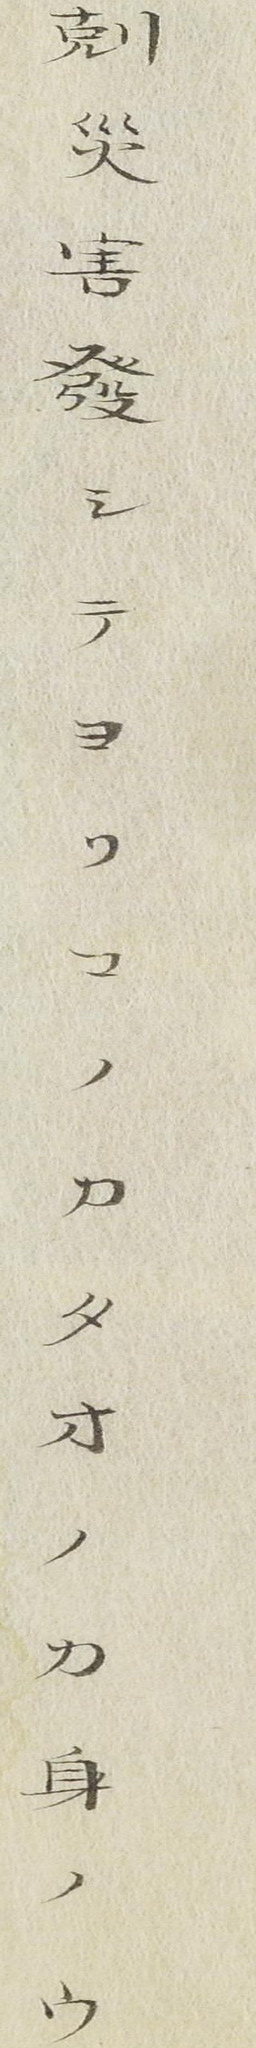剋災害発シテヨリコノカタオノカ身ノウ
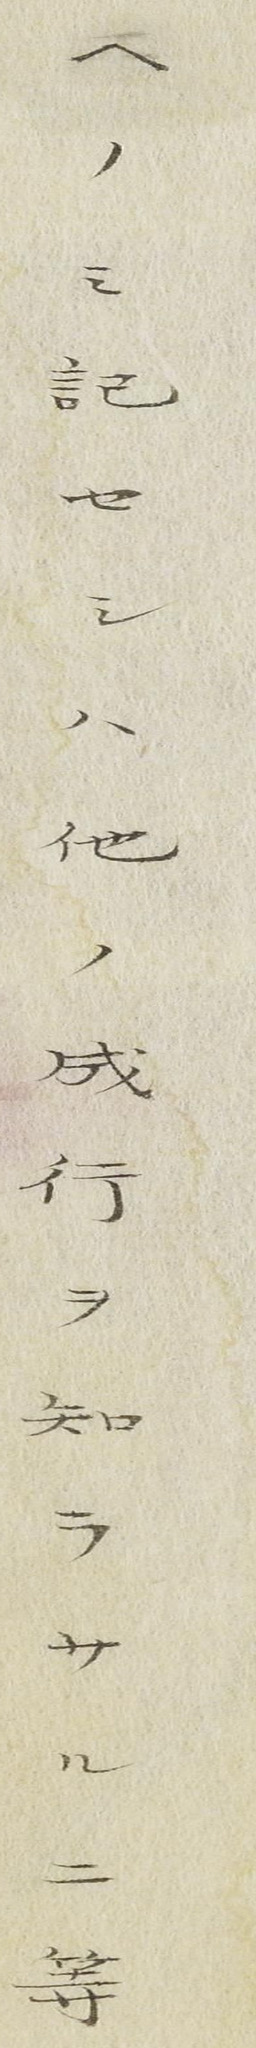ヘノミ記セシハ他ノ成行ヲ知ラサルニ等
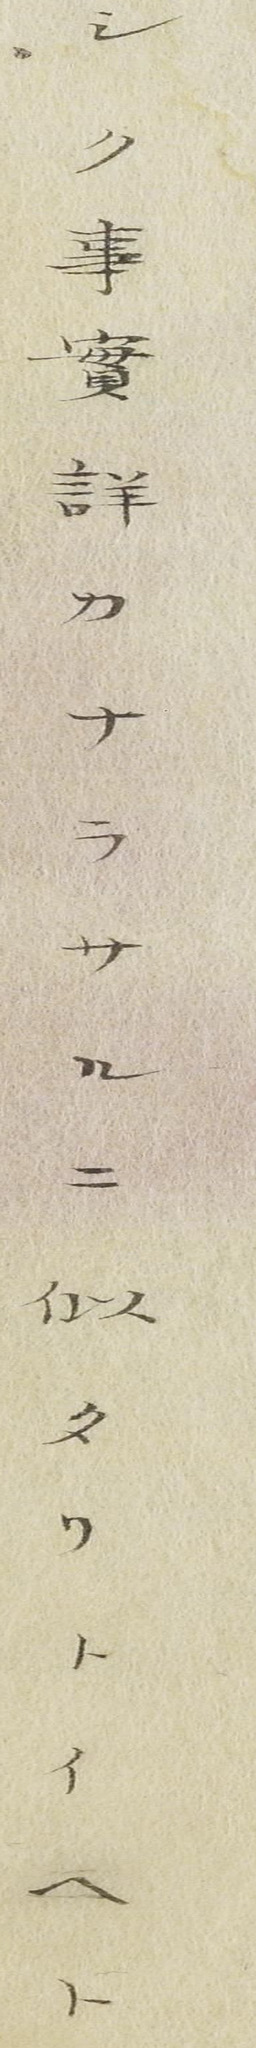シク事実詳カナラサルニ似タリトイヘト
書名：地災撮要　地震之部　巻ノ二
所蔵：東京大学地震研究所図書室 Earthquake Research Institute Library, The University of Tokyo, JAPAN
